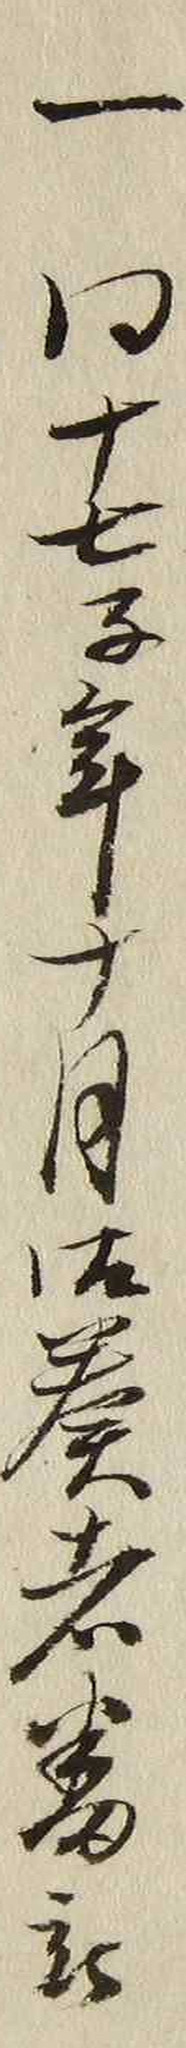一同十七子年十月御奏者番被
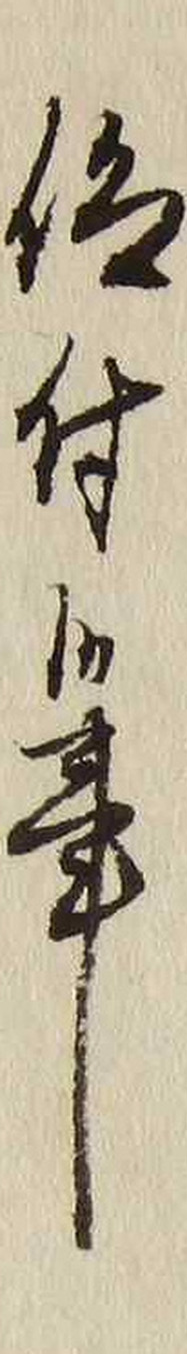仰付候事
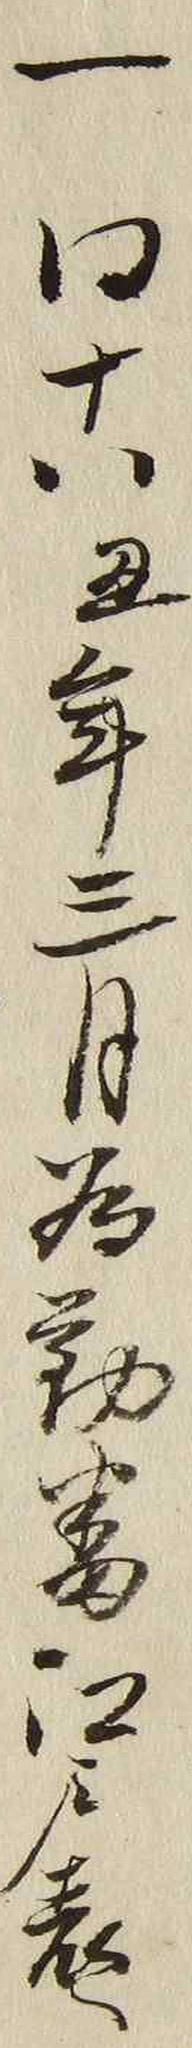一同十八丑年三月為勤番江戸表へ
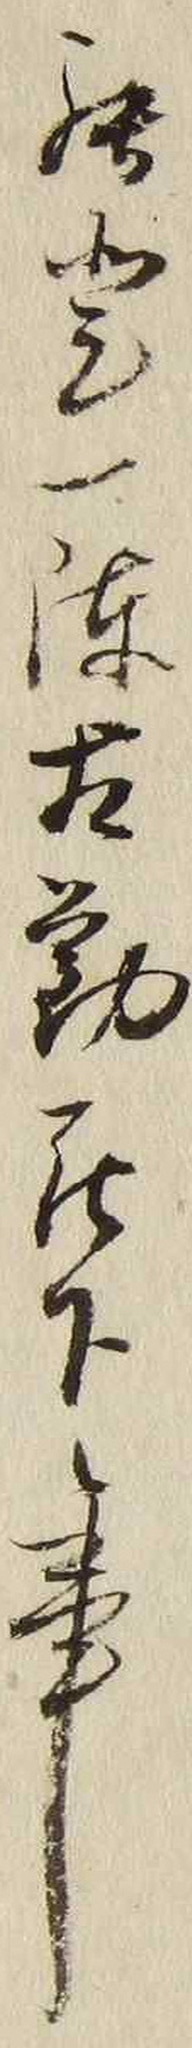罷登一陣相勤罷下候事
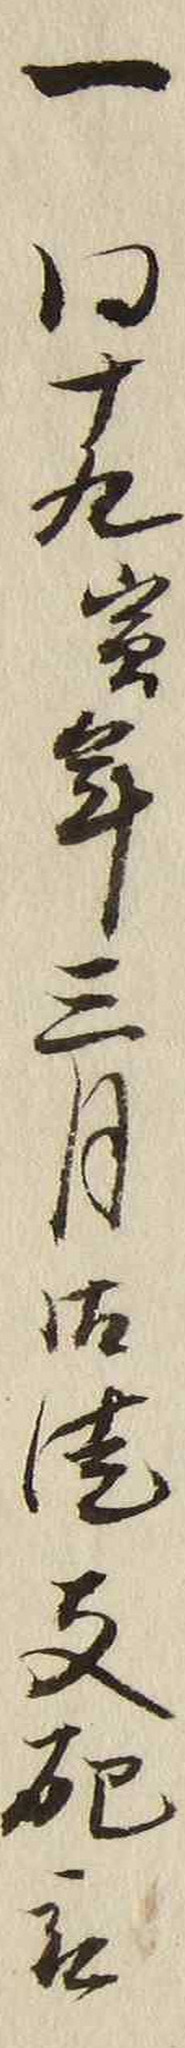一同十九寅年三月御徒支配被

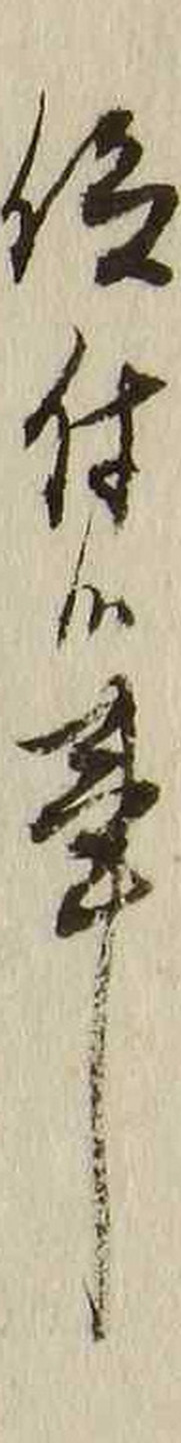仰付候事
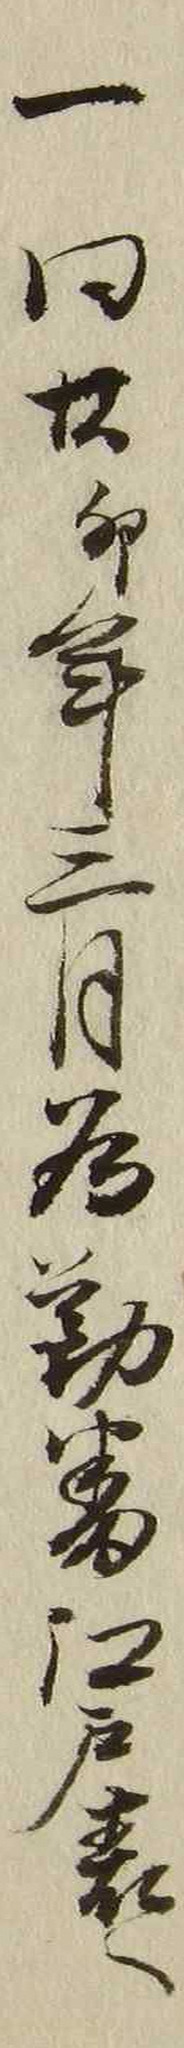一同廿卯年三月為勤番江戸表へ
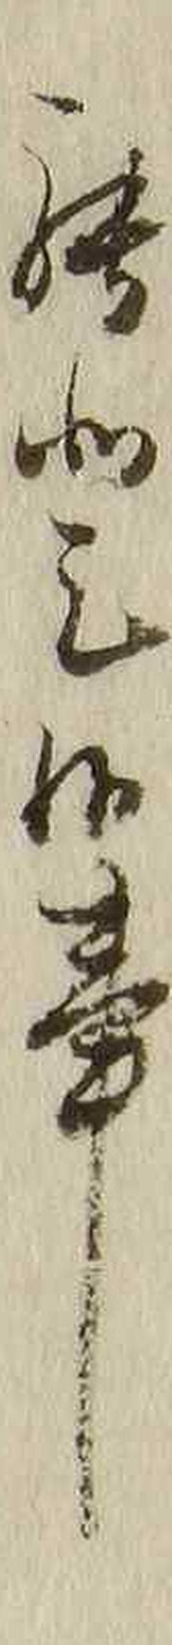罷登候事
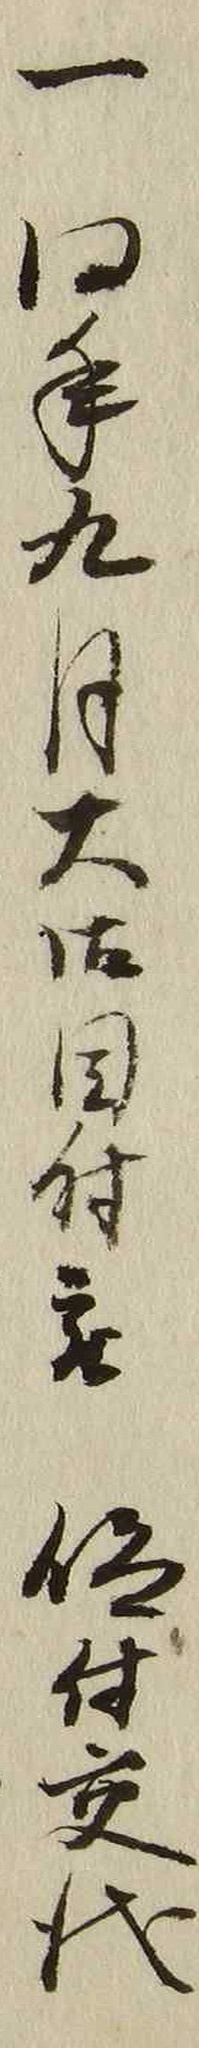一同年九月大御目付被仰付交代
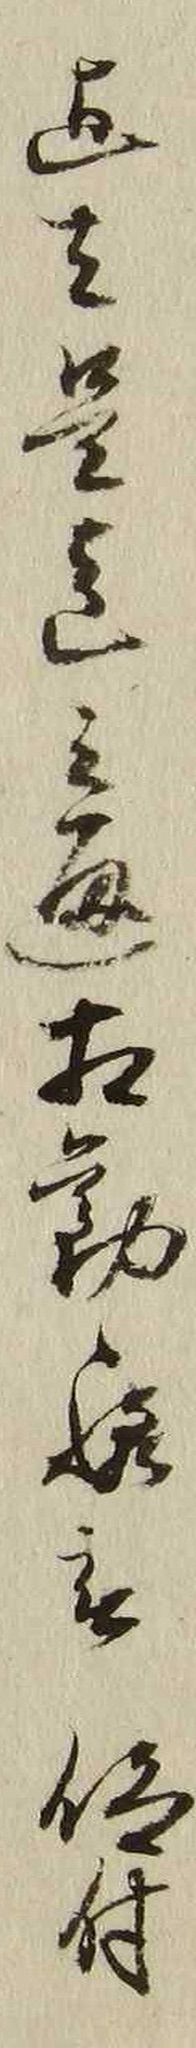迄者是迄之通相勤候様被仰付
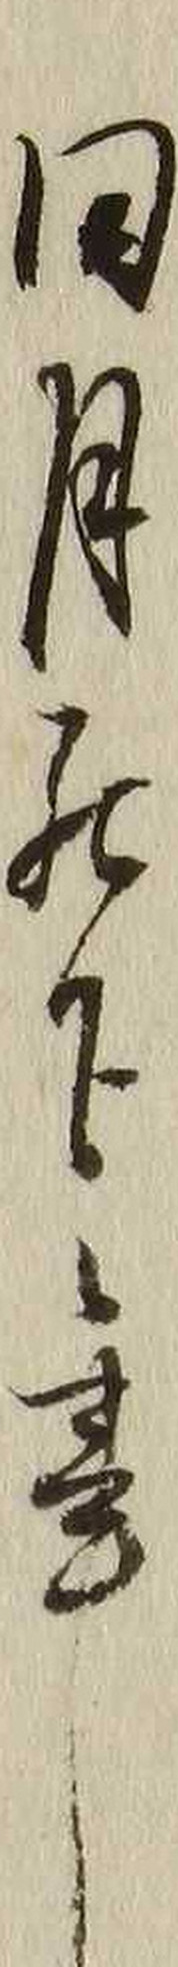同月罷下候事
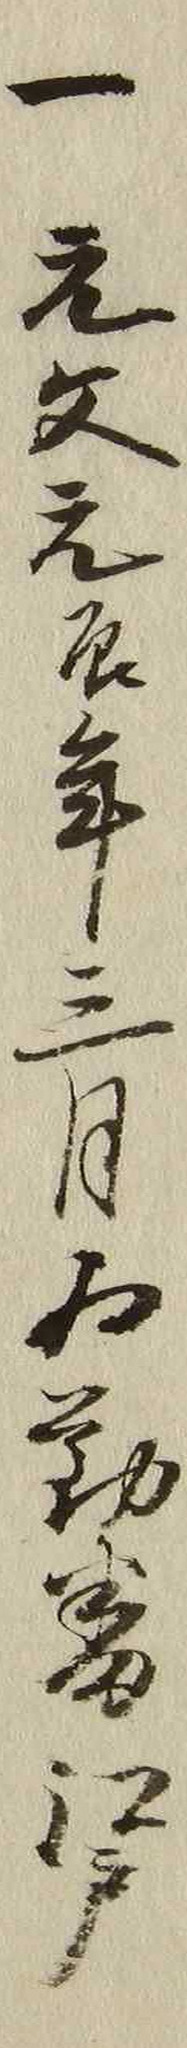一元文元辰年三月為勤番江戸
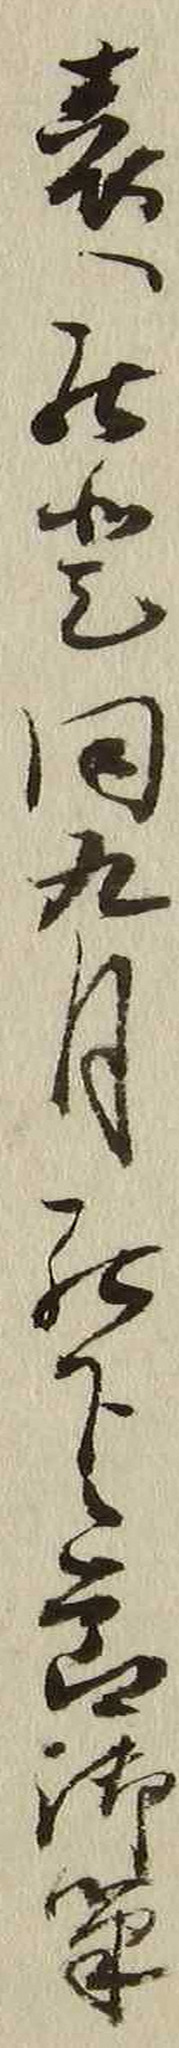表へ罷登同九月罷下候節御筆
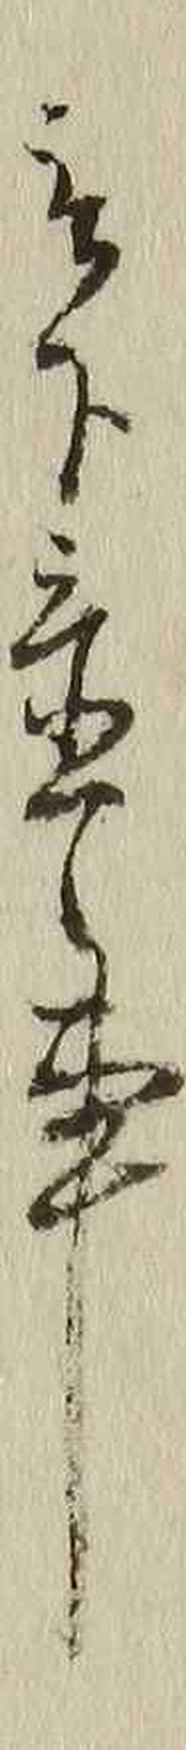被下置候事
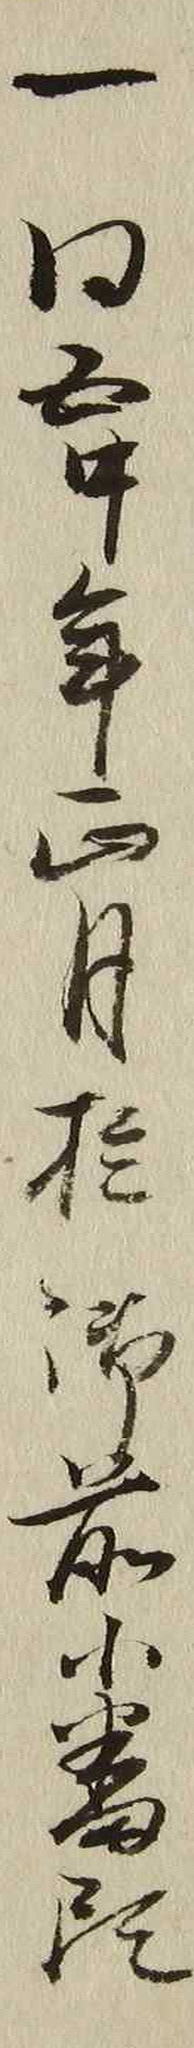一同五申年正月於御前小番頭
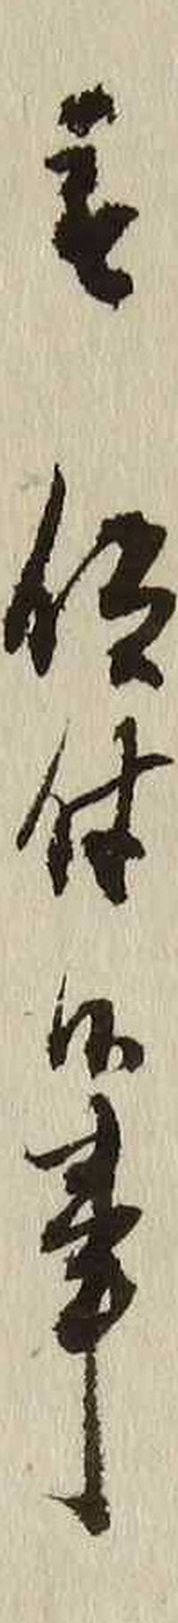被仰付候事
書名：諸士系譜　巻之348　も之部4
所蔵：会津若松市立会津図書館
